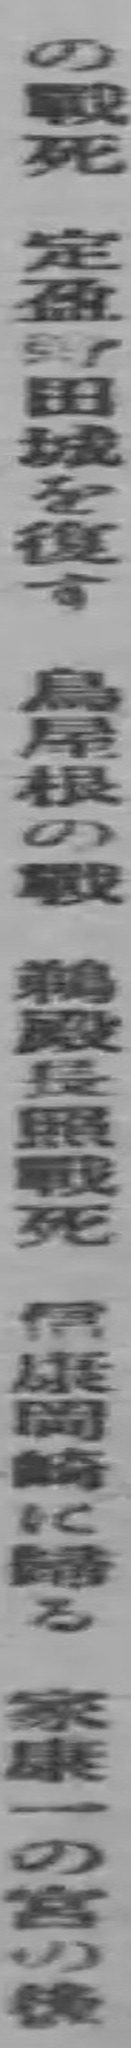の戦死定盈野田城を復す鳥屋根の戦鵜殿長照戦死信康岡崎に帰る家康一の宮の後
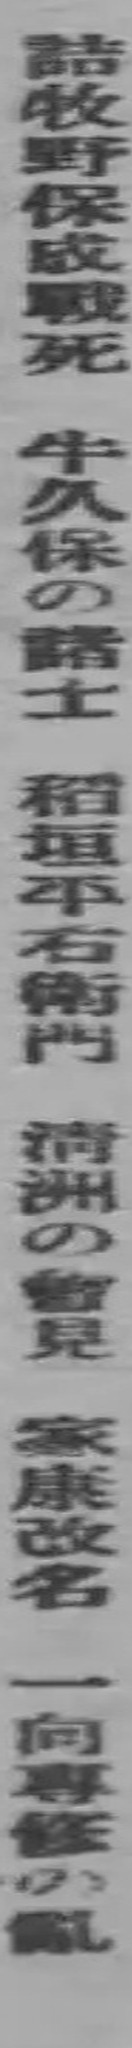詰牧野保成戦死牛久保の諸士稲垣平右衛門清洲の会見家康改名一向専修の乱
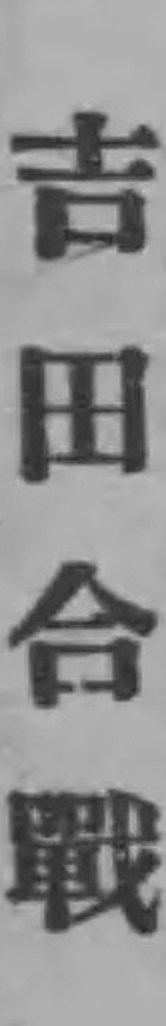吉田合戦
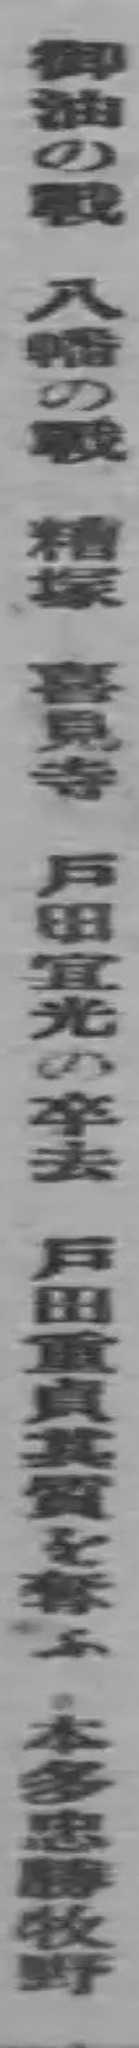御油の戦八幡の戦糟塚喜見寺戸田宜光の卒去戸田重貞其質を奪ふ本多忠勝牧野
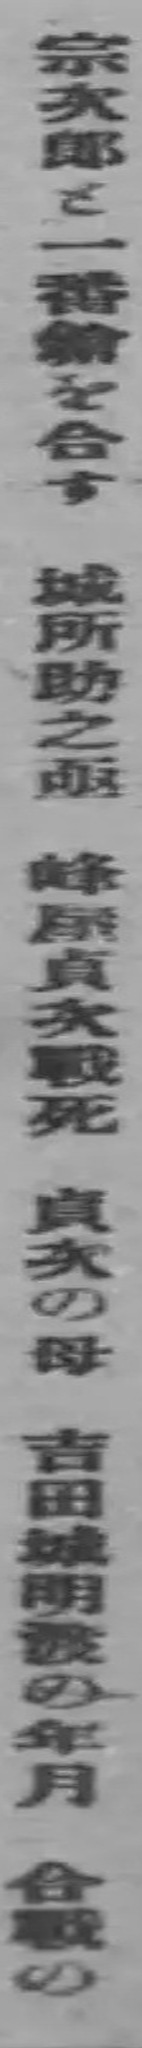宗次郎と一番鎗を合す城所助之丞峰屋貞次戦死貞次の母吉田城明渡の年月合戦の
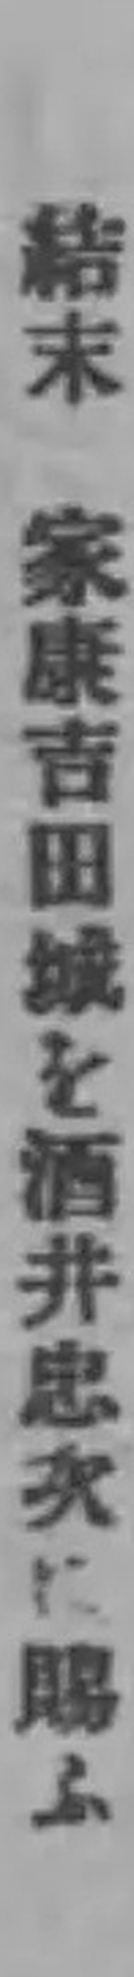結末家康吉田城を酒井忠次に賜ふ
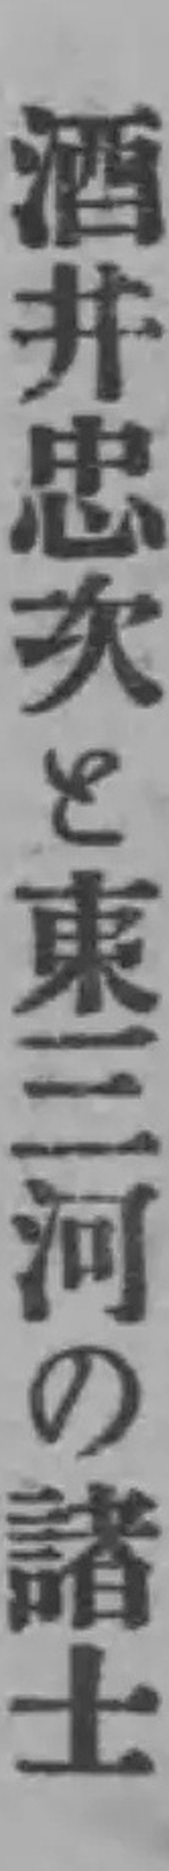酒井忠次と東三河の諸士
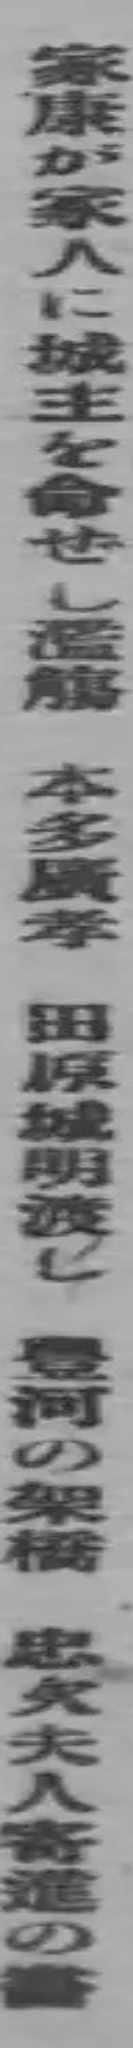家康が家人に城主を命ぜし濫觴本多広孝田原城明渡し豊河の架橋忠次夫人寄進の画
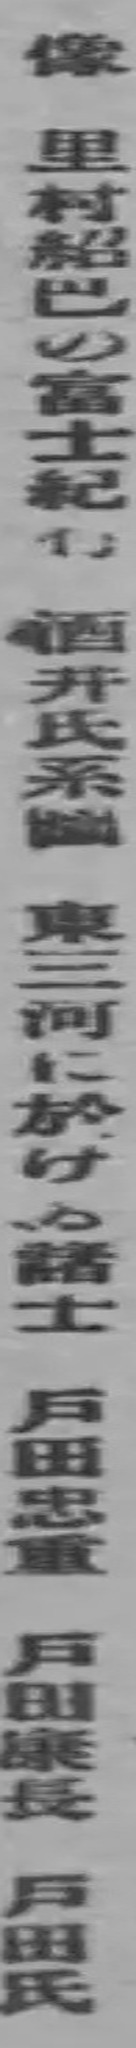像里村紹巴の富士紀行酒井氏系図東三河に於ける諸士戸田忠重戸田康長戸田氏
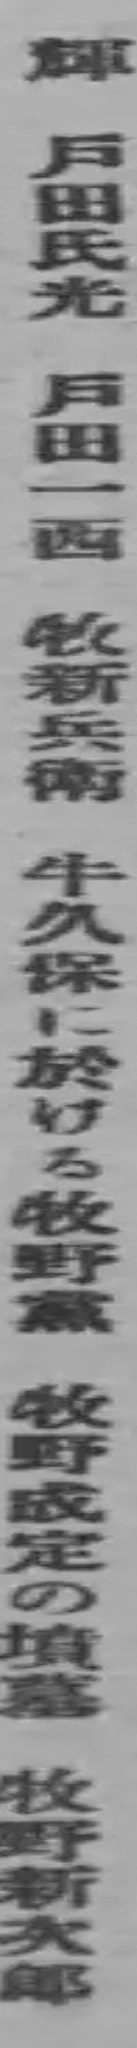輝戸田氏光戸田一西牧新兵衛牛久保に於ける牧野党牧野成定の墳墓牧野新次郎
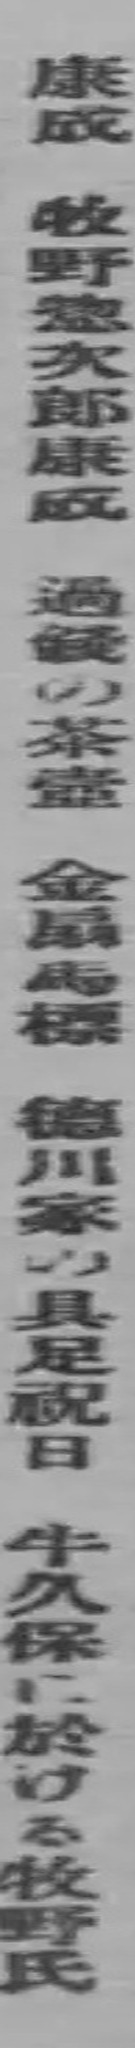康成牧野惣次郎康成過銭の茶壺金扇馬標徳川家の具足祝日牛久保に於ける牧野氏
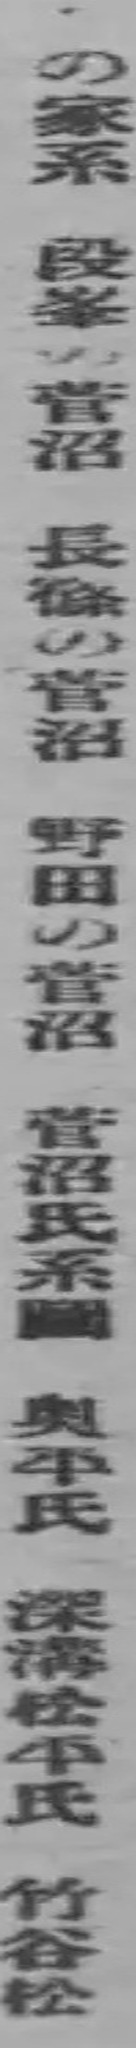の家系段峯の菅沼長篠の菅沼野田の菅沼菅沼氏系図奥平氏深溝松平氏竹谷松
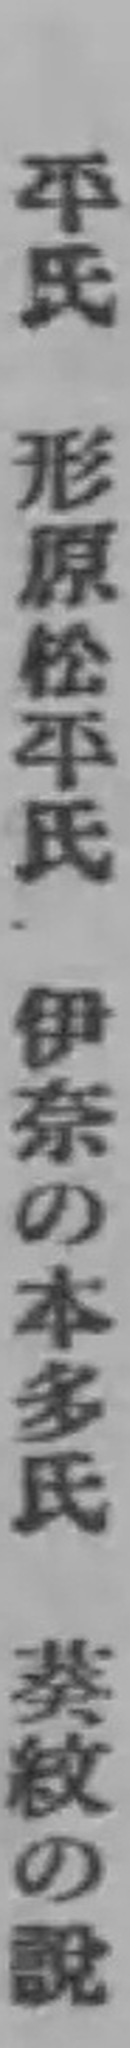平氏形原松平氏伊奈の本多氏葵紋の説
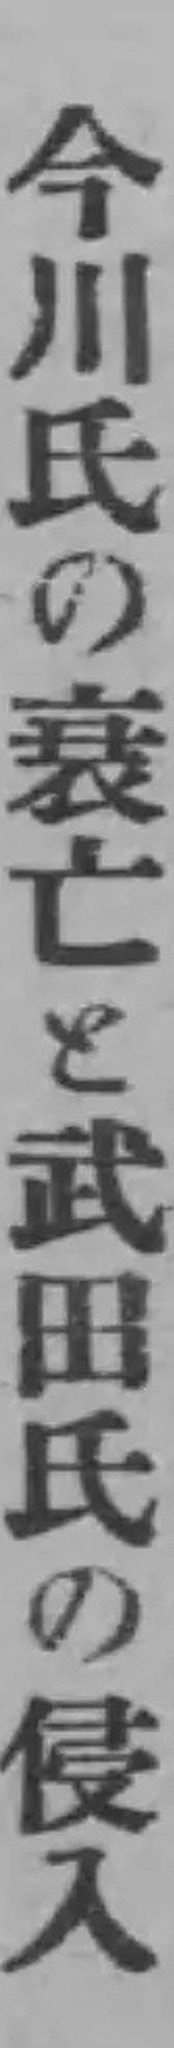今川氏の衰亡と武田氏の侵入
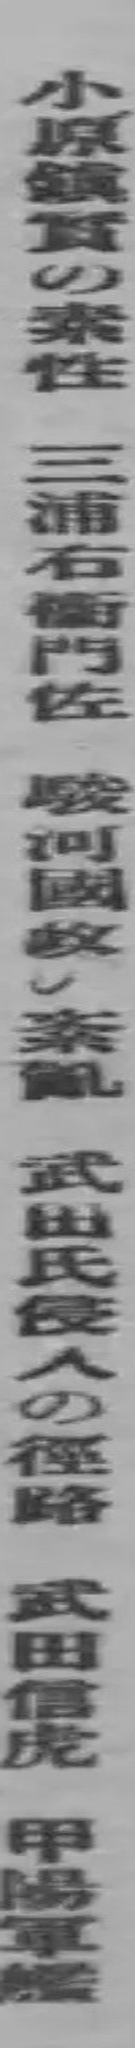小原鉄実の素性三浦右衛門佐駿河国政の紊乱武田氏侵入の径路武田信虎甲陽軍鑑
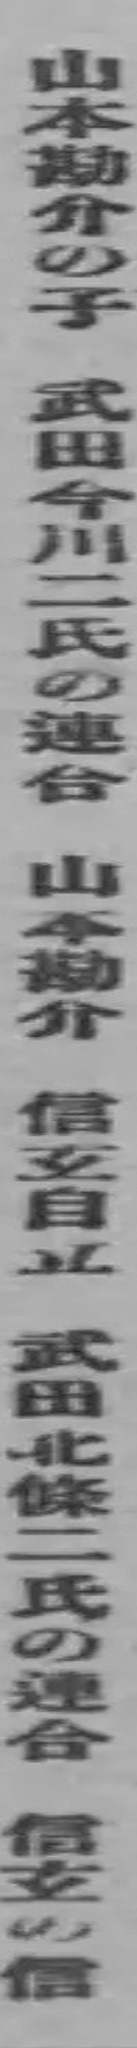山本勘介の子武田今川二氏の連合山本勘介信玄自立武田北条二氏の連合信玄の信
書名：豊橋市史談
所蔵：国立国会図書館 National Diet Library, JAPAN
